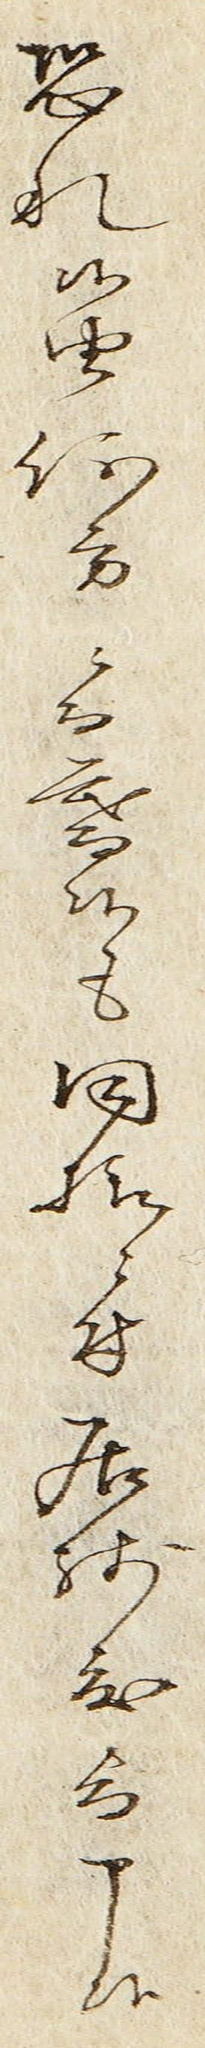恐れ候故何方に而暮候も同様に付居残度旨申候
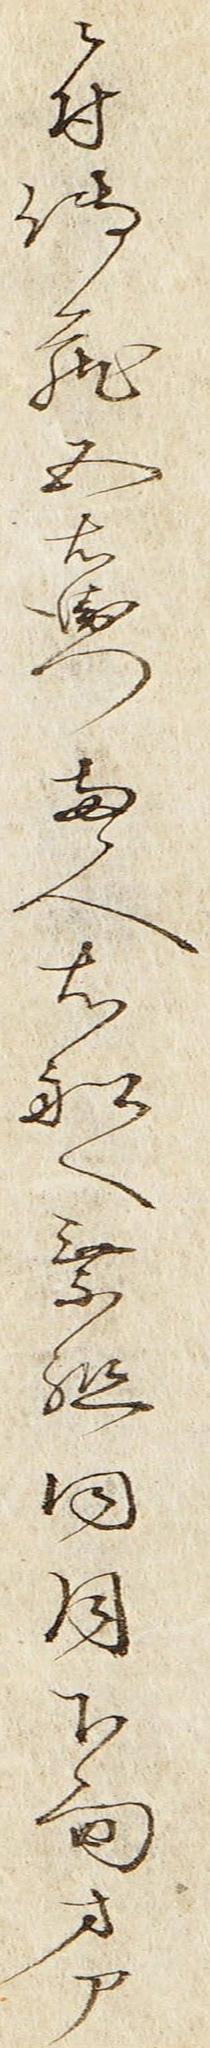に付伝蔵五右衛門両人右船へ乗組同月下旬オア
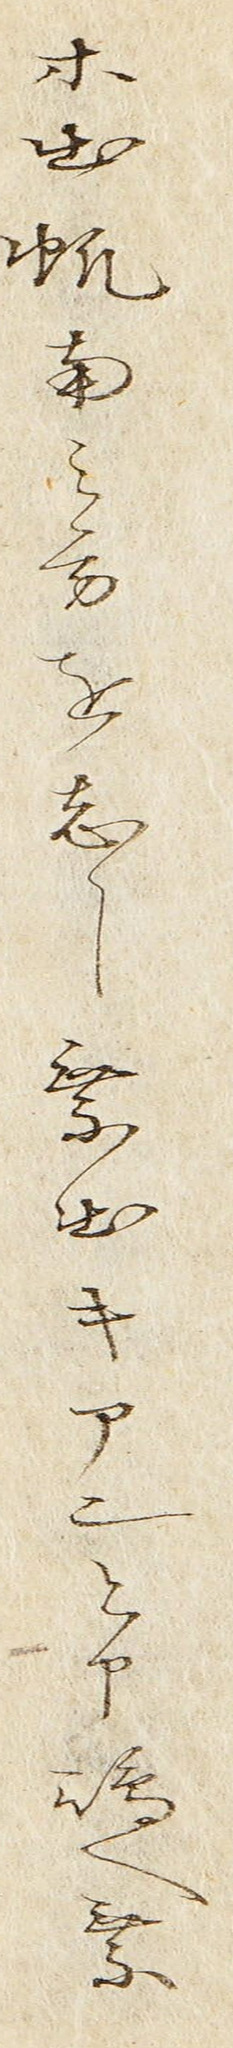ホ出帆南之方を志し乗出キアンと申嶋へ乗
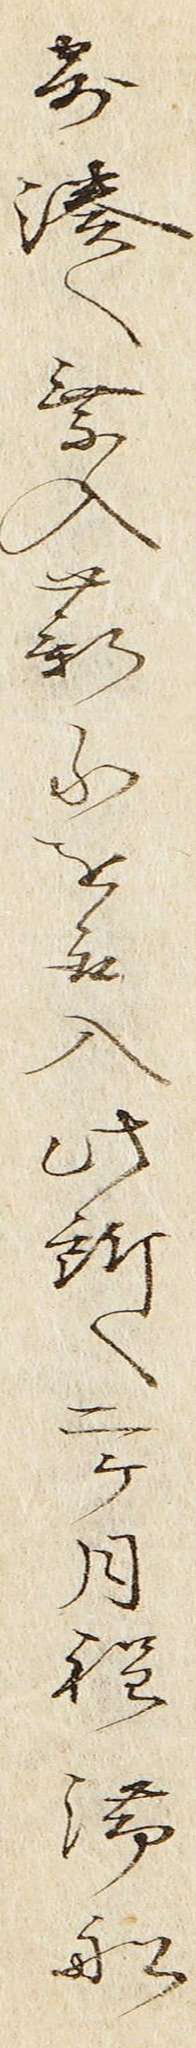寄湊へ乗入薪水を取入此所へ二ヶ月程滞船
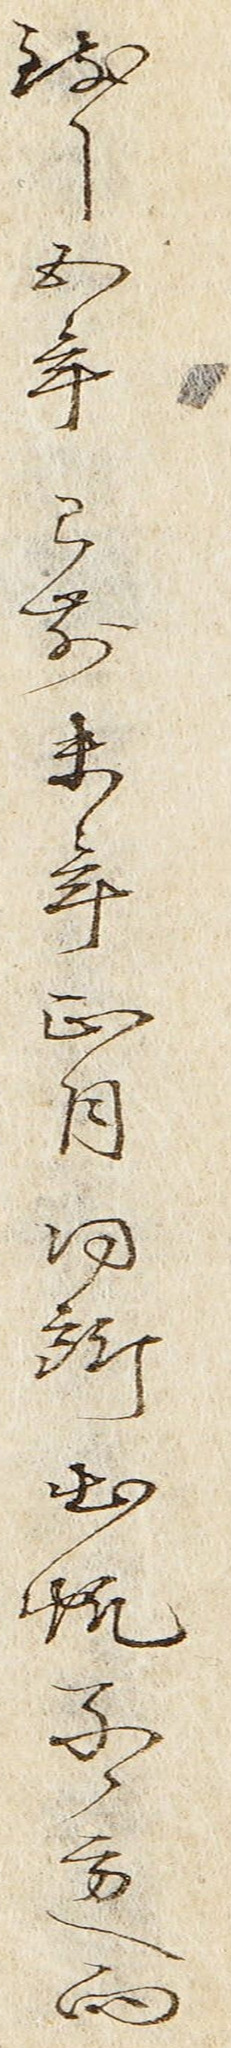致し五年已前未年正月同所出帆子方へ向
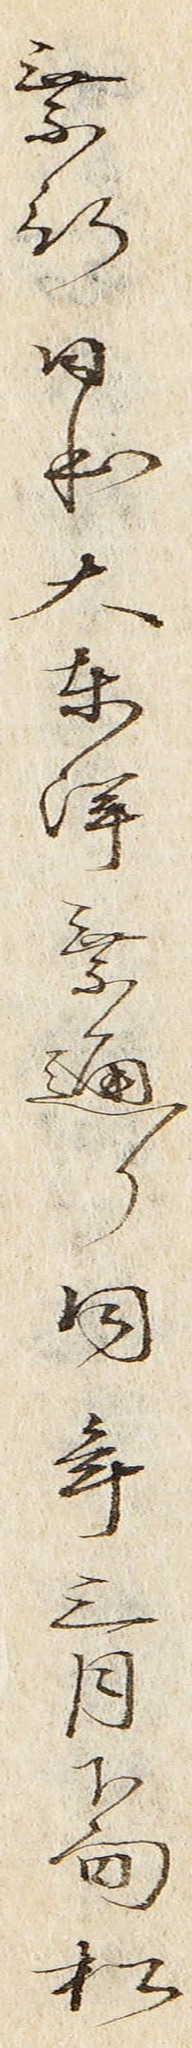乗行日本大東洋乗通り同年三月下旬松
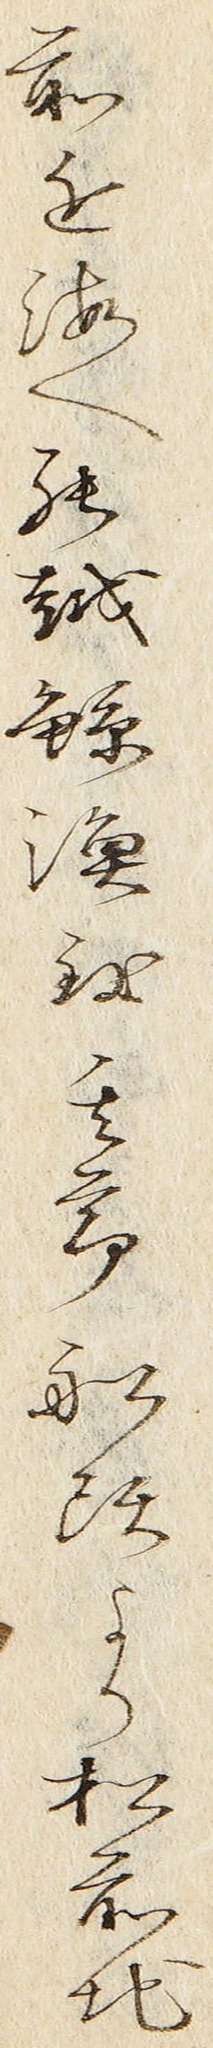前近海へ罷越鯨漁致其節船頭より松前地
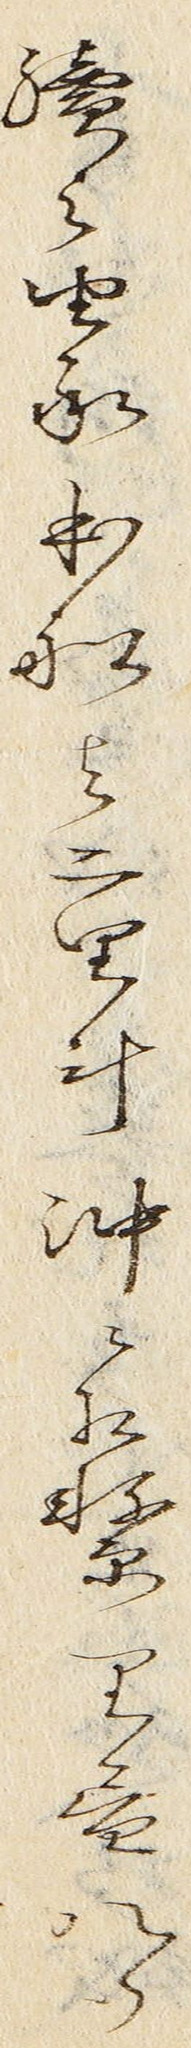続之由承本船は二里計沖に相繋り昼八ッ
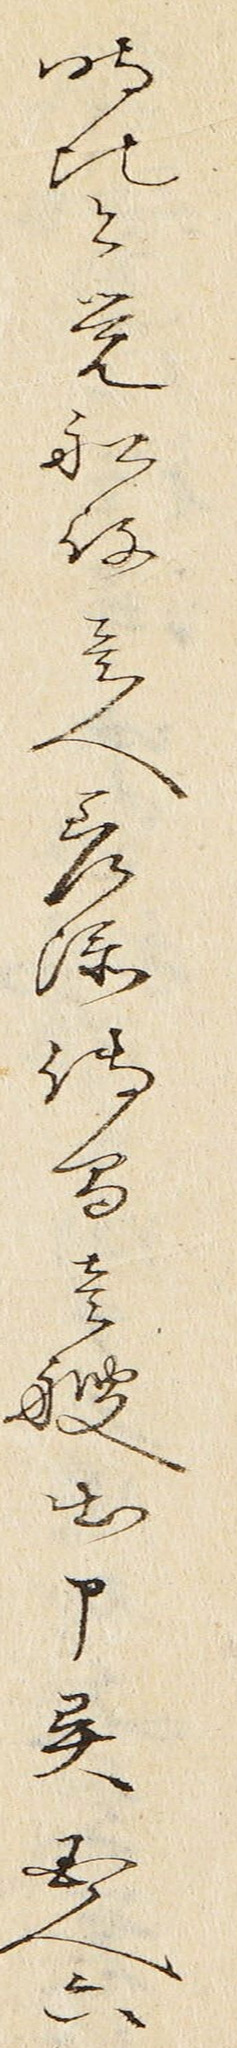時比と覚ふ船役壱人差添伝間壱艘出申異国人六
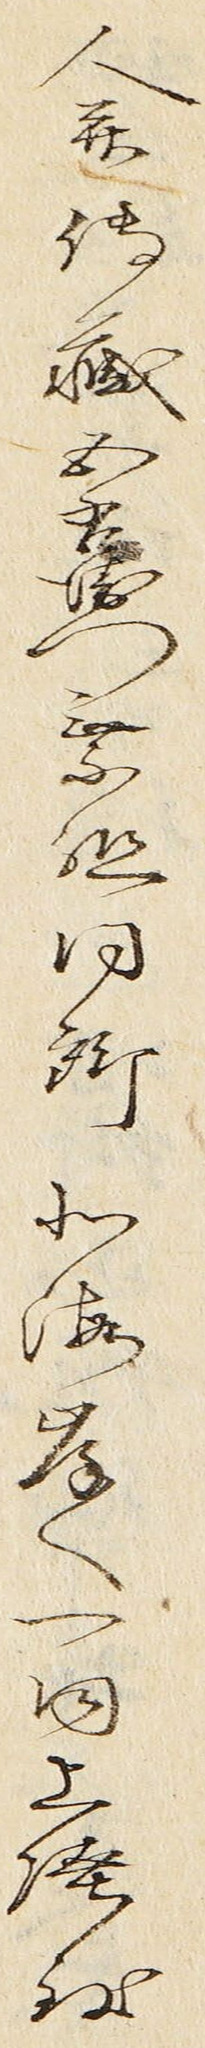人并伝蔵五右衛門乗組同所北海岸へ一同上陸致
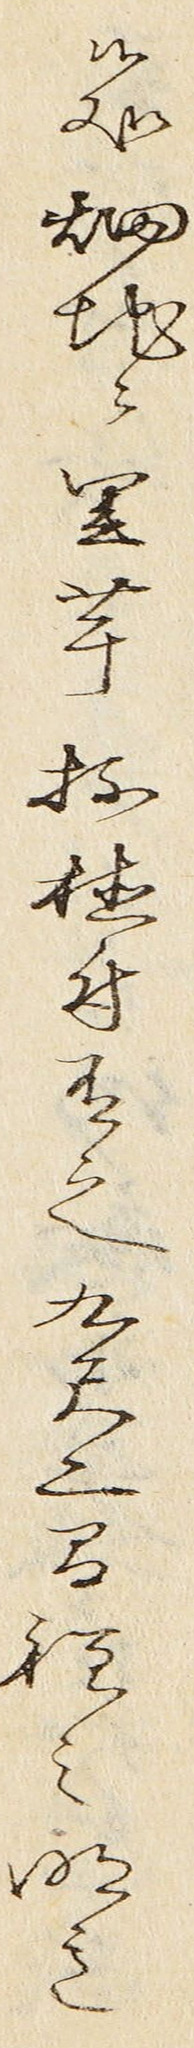候処畑地に里芋抔植付有之九尺二間程之明意
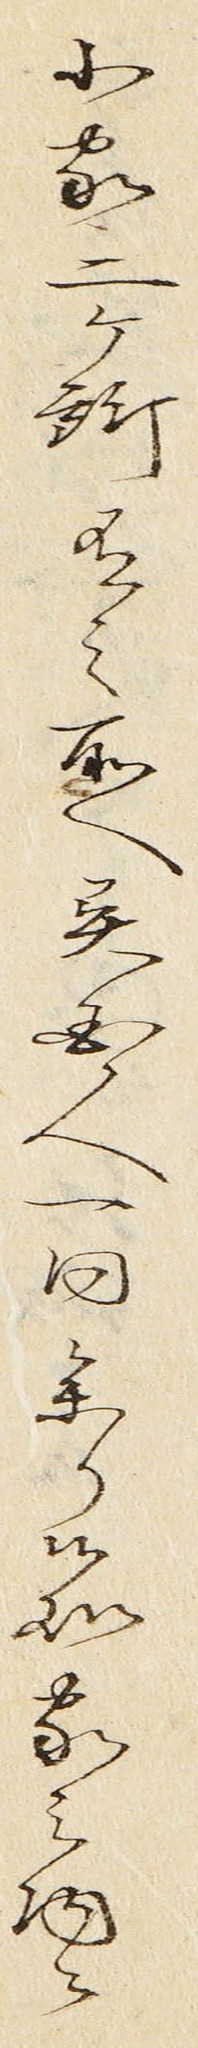小家二ヶ所有之所へ異国人一同参り候処家之内に
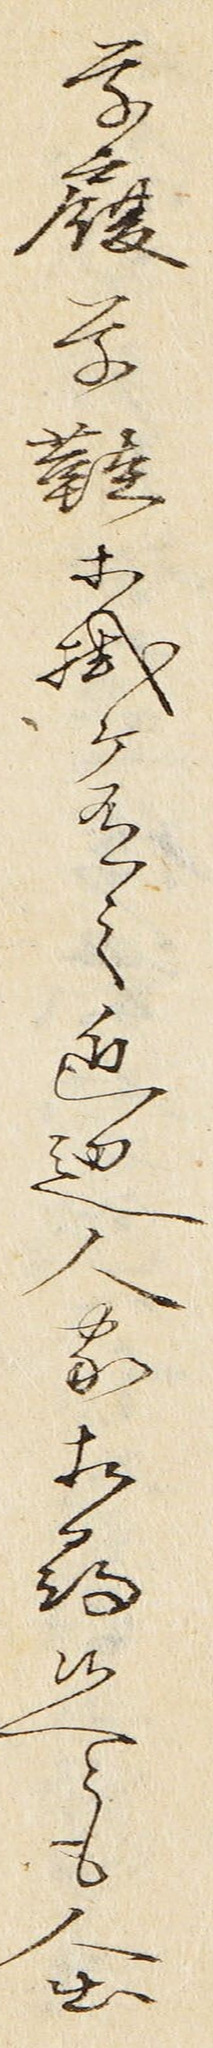草履草鞋等掛ヶ有之近辺人家相尋候へとも人出
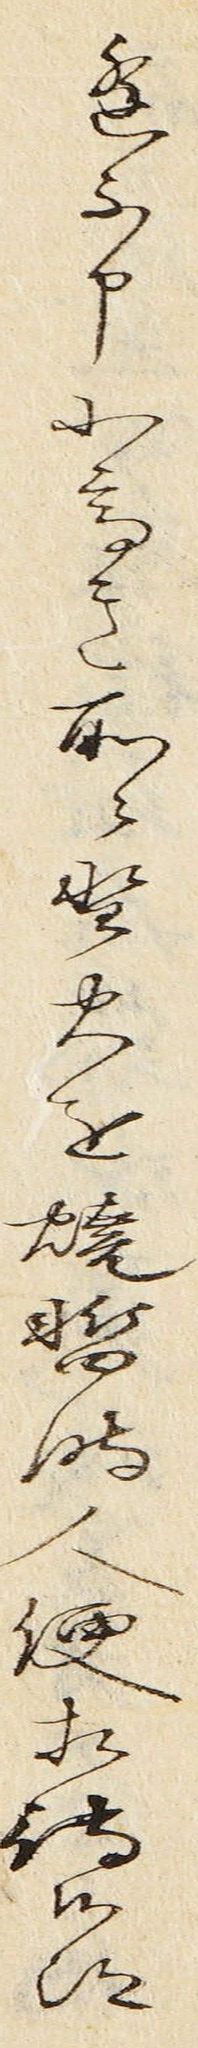逢不申小高き所に野火を焼暫時人便相待候得
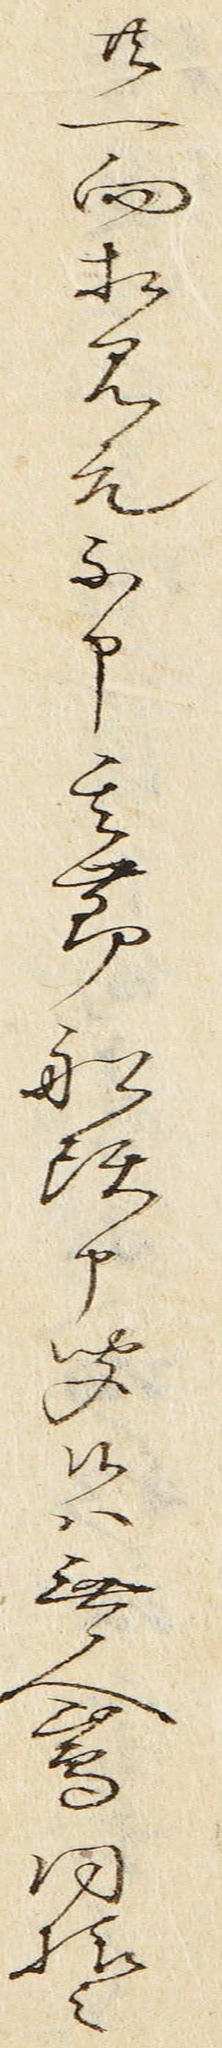共一向相見え不申其節船頭申聞候は無人嶌同様之
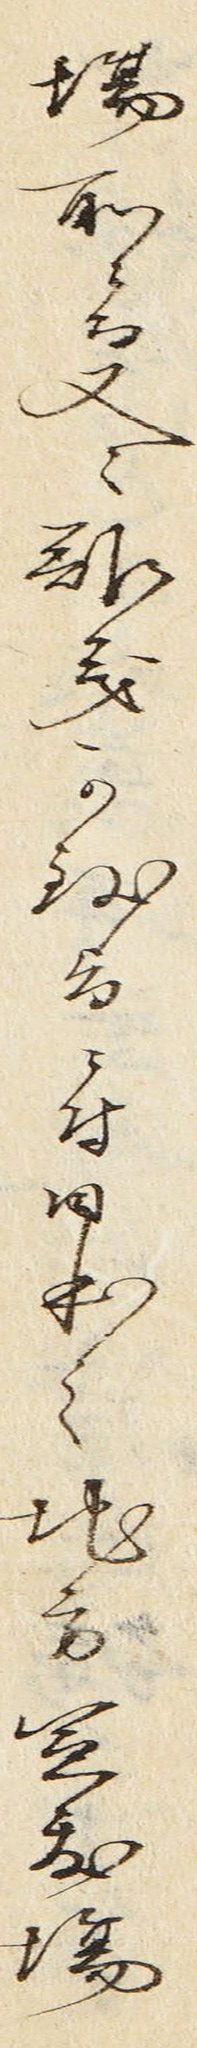場所に而又々難義可致旨に付日本之地方宜敷場
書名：土佐中浜万次郎漂流記
